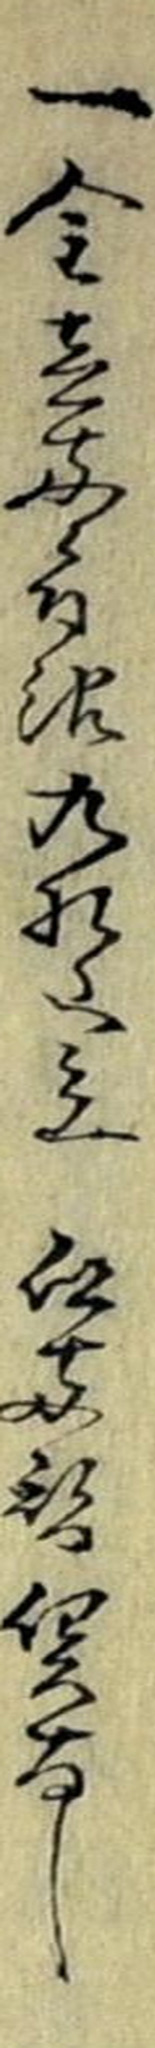一金壱両ニ付銀九拾匁立但両替賃なし
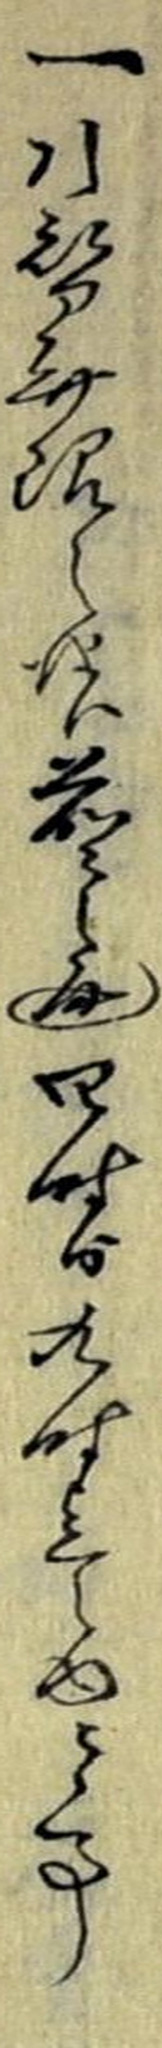一引替刻限之儀ハ前々之通四時ゟ九時迄之内ニ候事
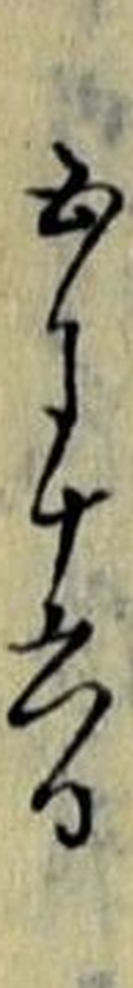五月十六日
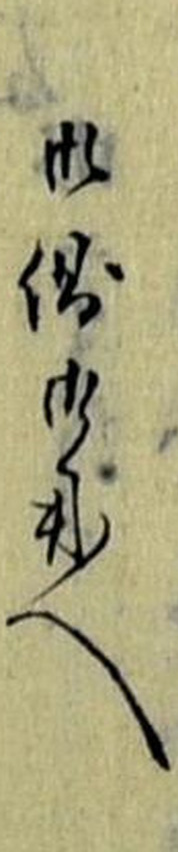御側御用人
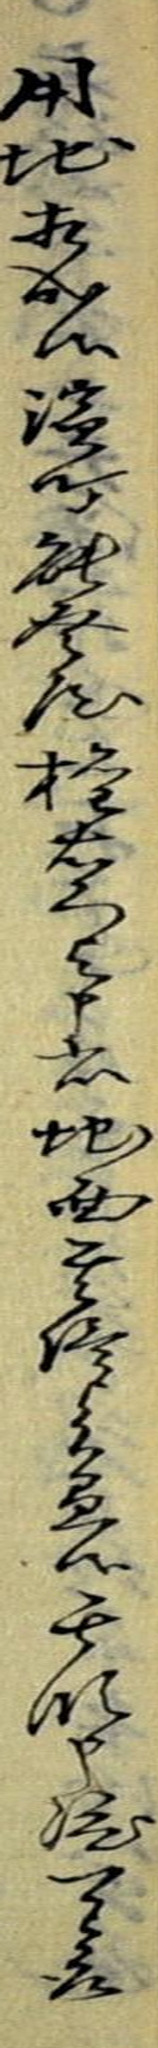用地相成候浜町能登屋権右衛門与申者地面其儘被下置候其段申渡可被取
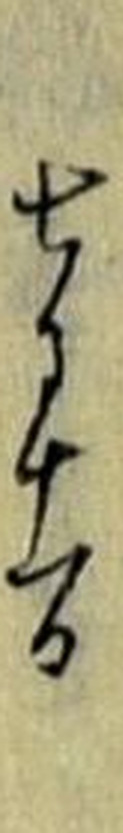七月十一日
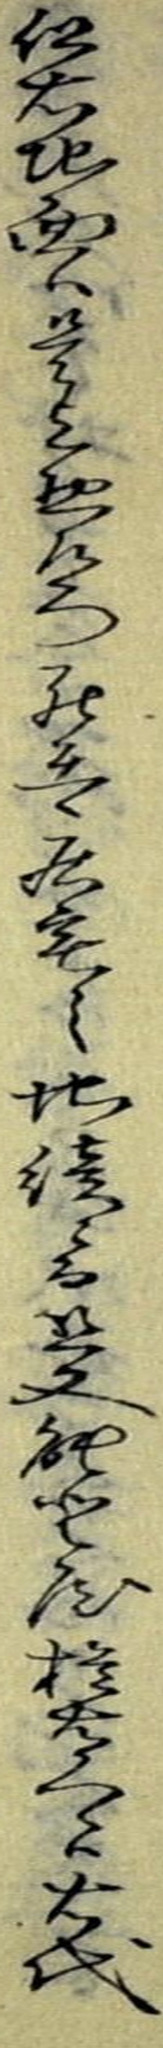但右地面ハ是迄惣左衛門罷在候居宅之地続ニ而且又能登屋権右衛門ハ右代
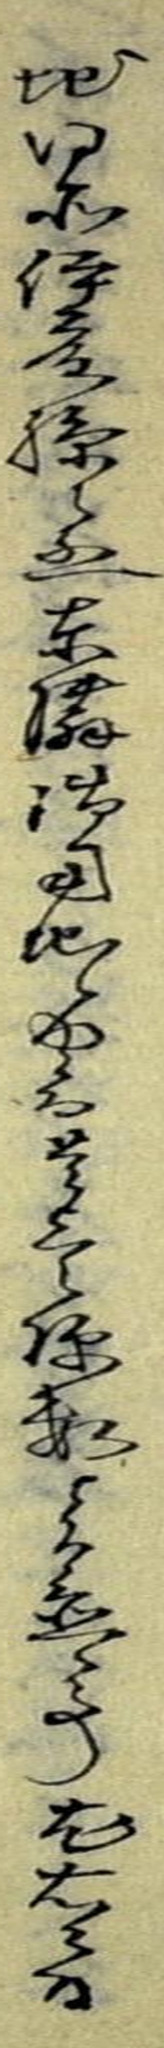地同所伊藤孫之丞東隣御用地之内ニ而是迄之坪数被下置候事尤右ニ付
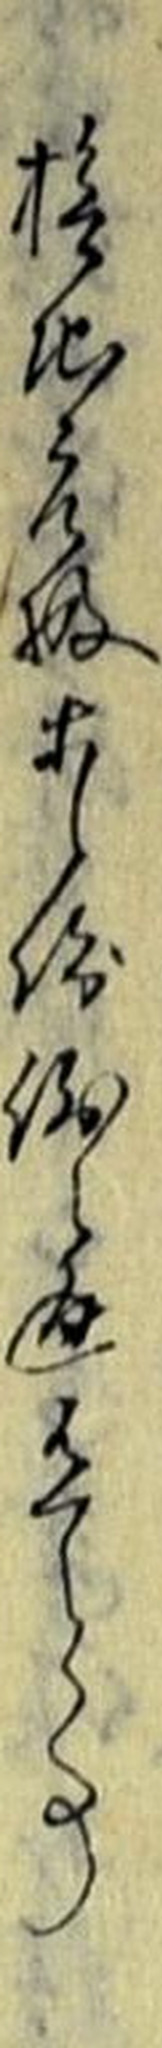捨地取扱等之儀例之通有之事
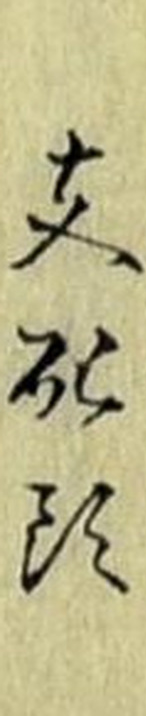支配頭
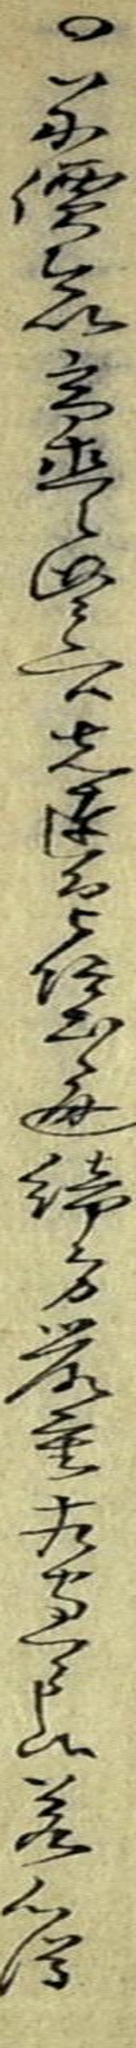○米価今以高直候趣ニ候へハ先達而被仰出候通締方厳重相守可申候若心得
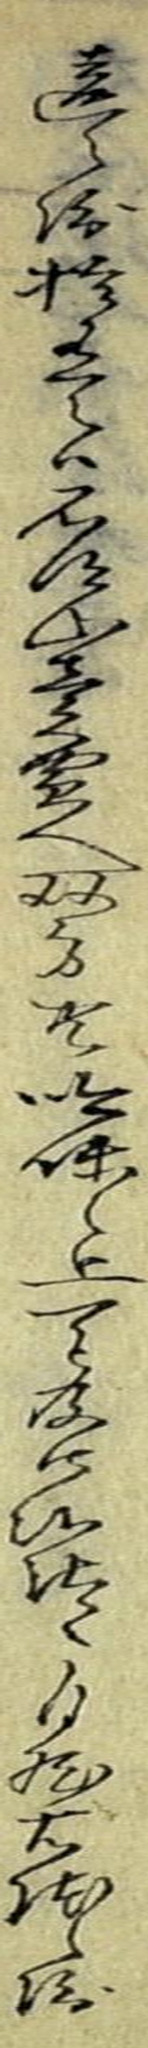違之儀於有之ハ右仰出売買人双方共吟味之上被及御沙汰候自然右体之儀
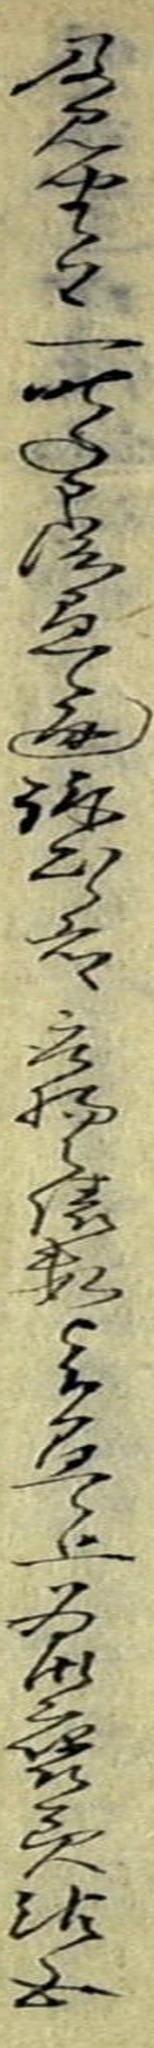及見聞候ハヽ一昨年申渡置候通訴出候者へ取扱之俵数被下置候上為御褒美銀五
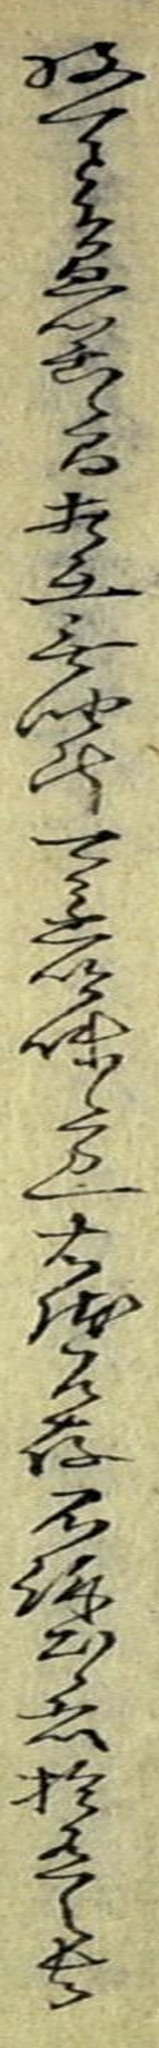枚可被下置筈候間相互無油断可遂吟味候万一右体乍存不訴出候者於有之者
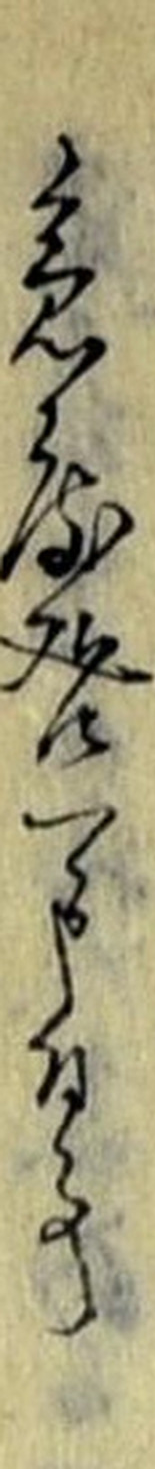急度咎可申付事
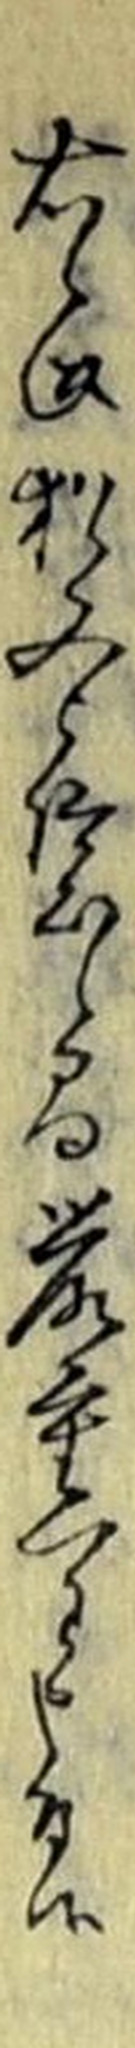右之趣猶又被仰出候間厳重可被申付候
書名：命令之部 五
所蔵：福井県文書館 Fukui Prefectural Archives
